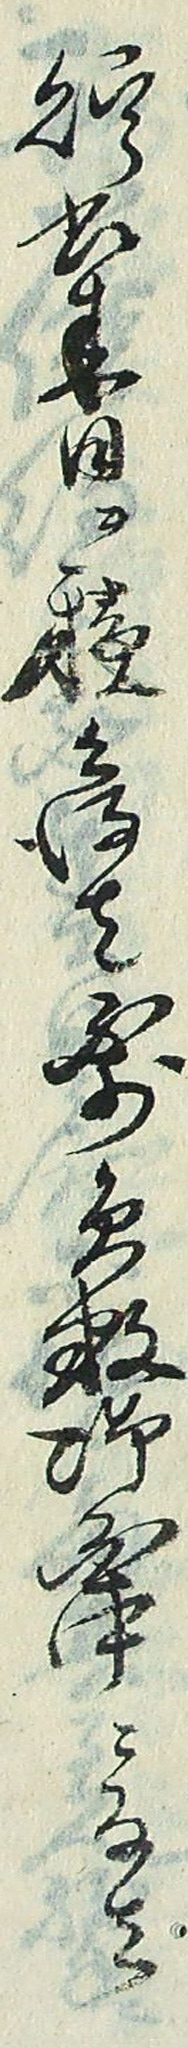貯出来日ヲ積候得者不少員数御国中ニ而者

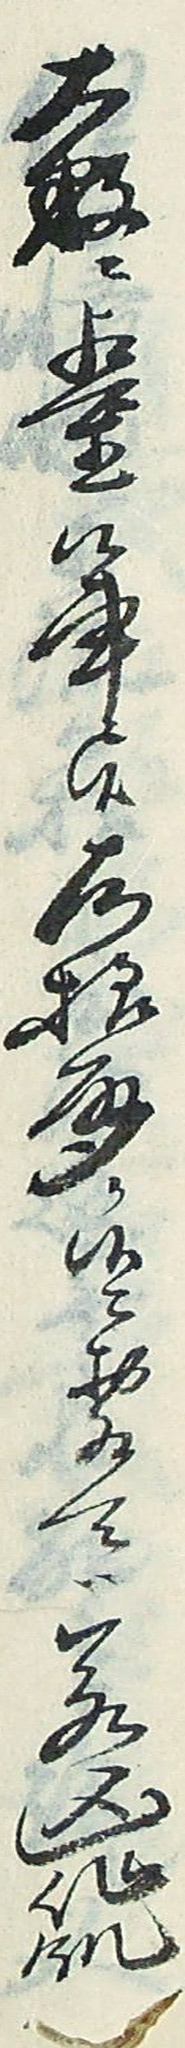大数ニ相至候事ニ候右様取〆り候ニおゐてハ若凶作飢
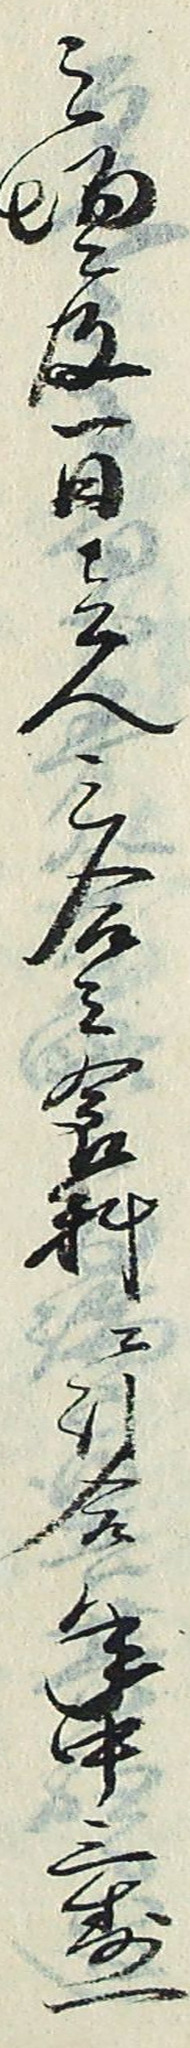之場ニ及一日壱人三合之食料ニ引合年中三歩一
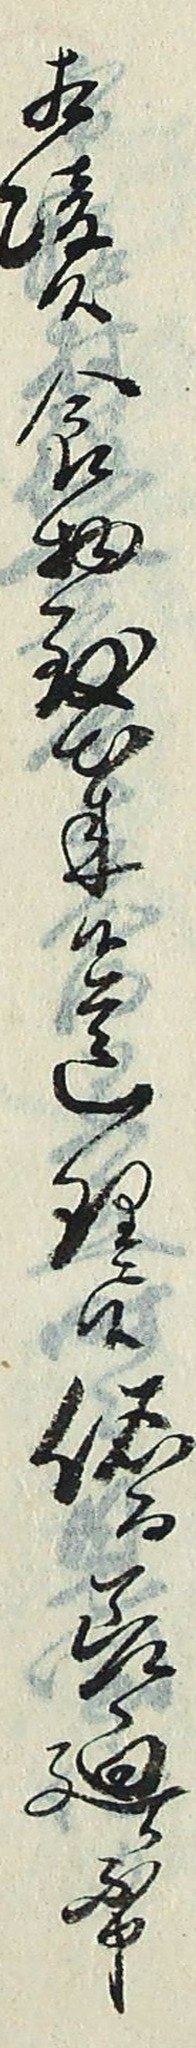相凌候食物致出来候道理ニ候依而差廻り不申
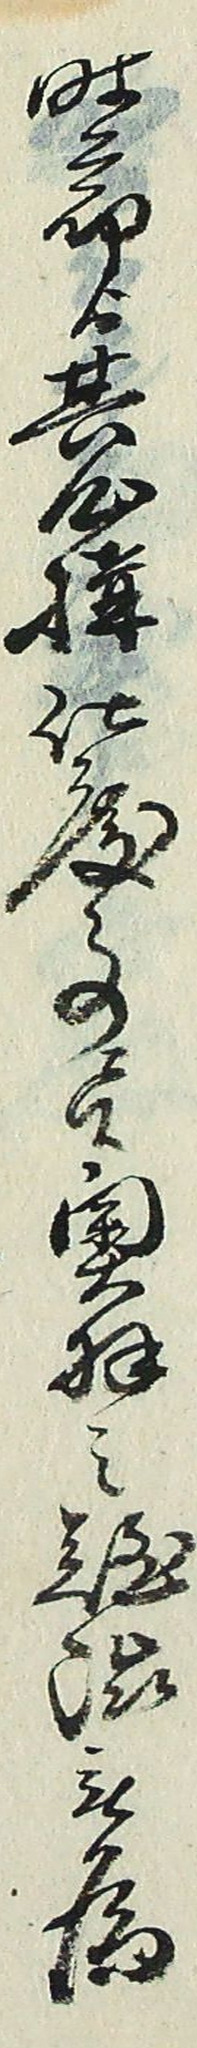時節ゟ其心構仕度事ニ候奥羽之難渋被為
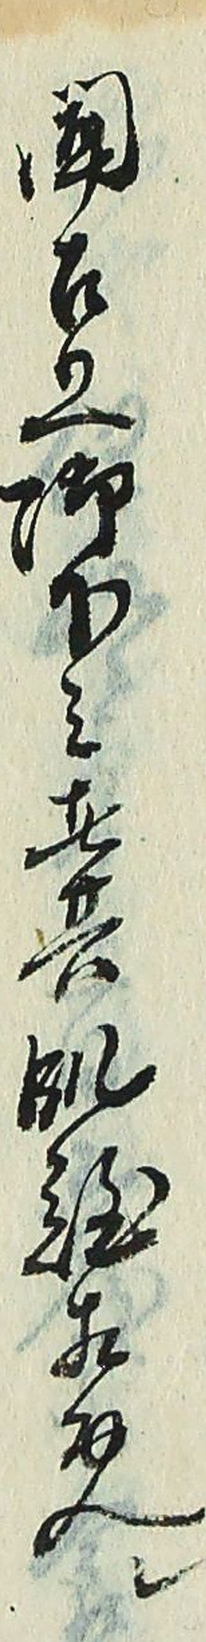聞召上御下之者共飢難相免シ
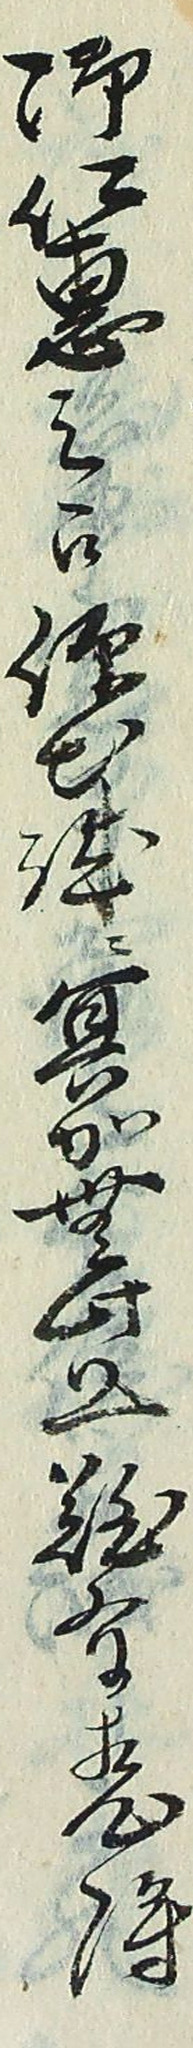御仁恵之被仰出誠ニ冥加無此上難有相心得
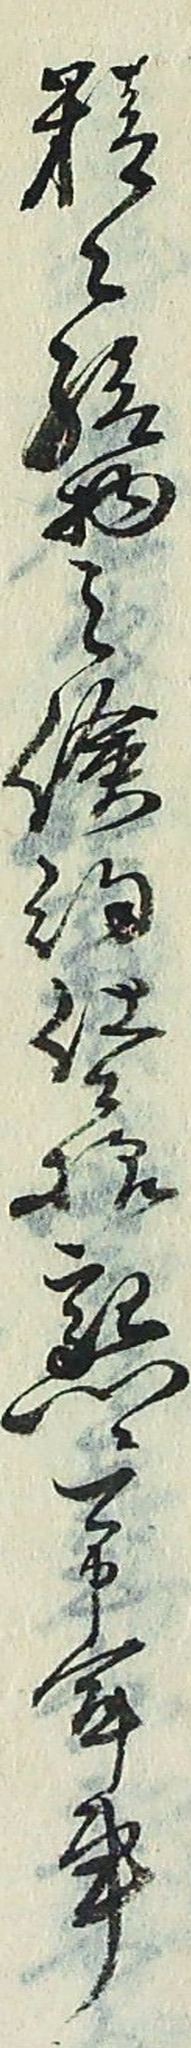精々給物之倹約仕候様熟懇ニ可申聞事
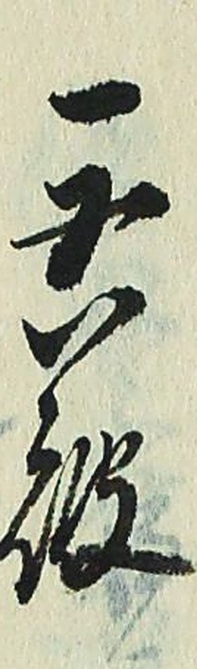一右被
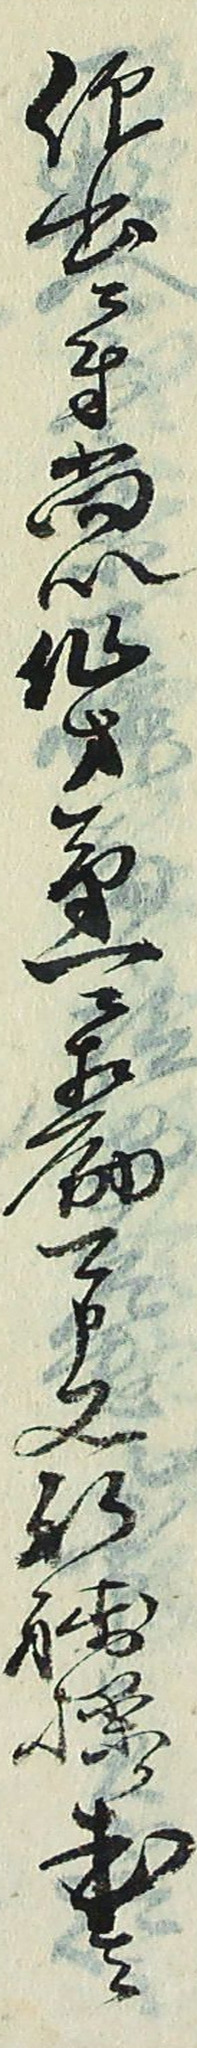仰出ニ付尚以作方第一ニ相励可申又祈祷繰り成者
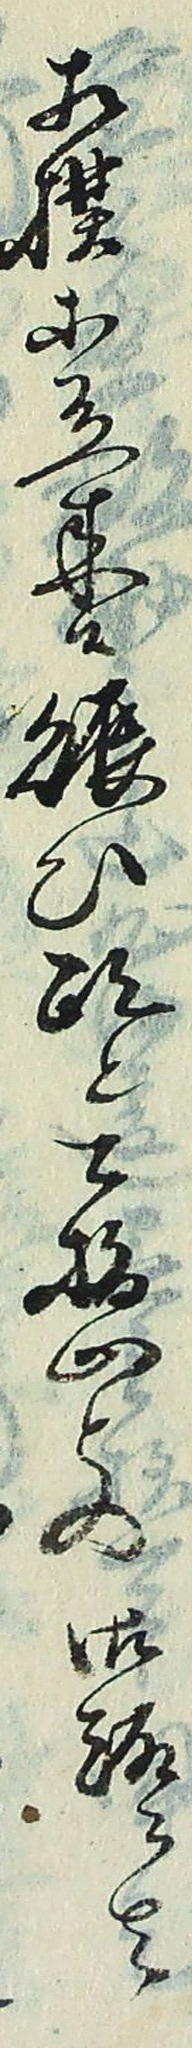相撲等有来候賑ひ屹と可指止との御趣ニ者
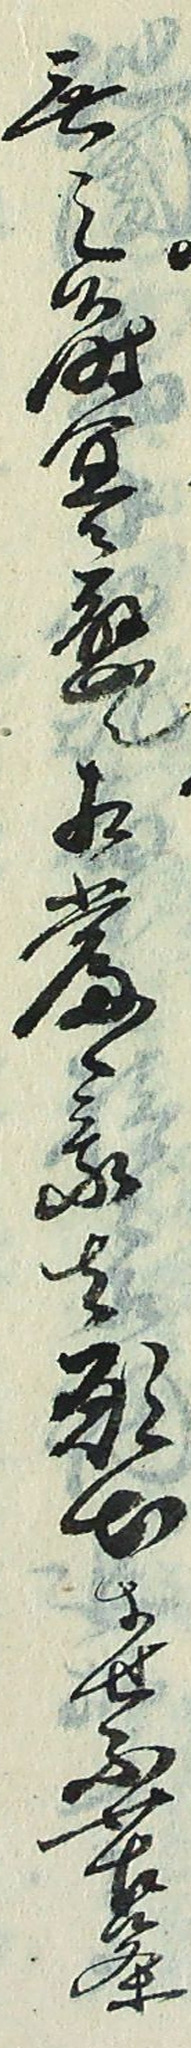無之候時宜々應シ相當候義者願出させ不苦候条
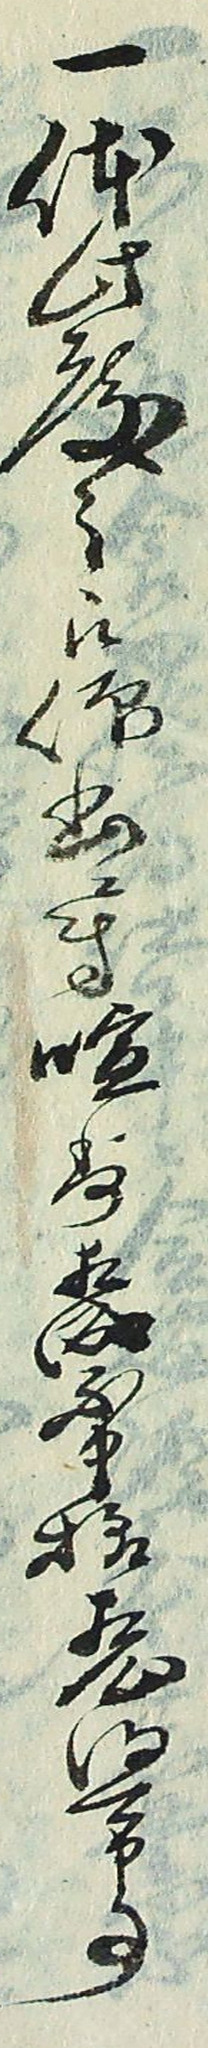一体此度之被仰出ニ付喧布相成不申様相心得可申事
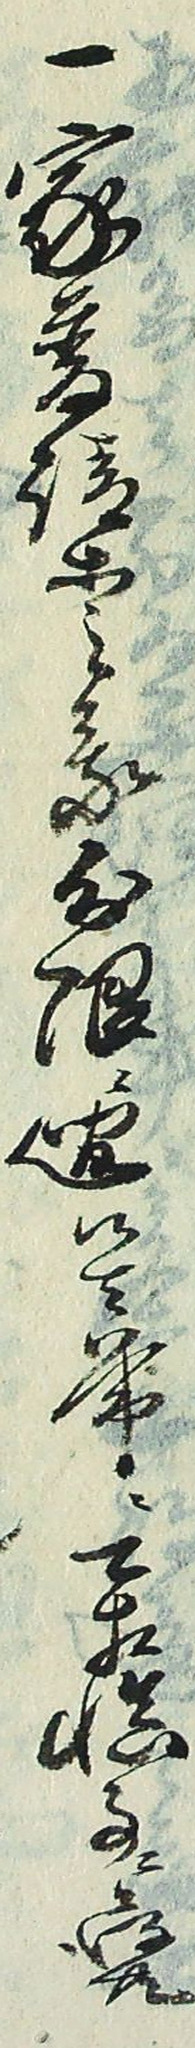一家普請等之義分限ニ過候者常ニ可相慎事ニ候得共
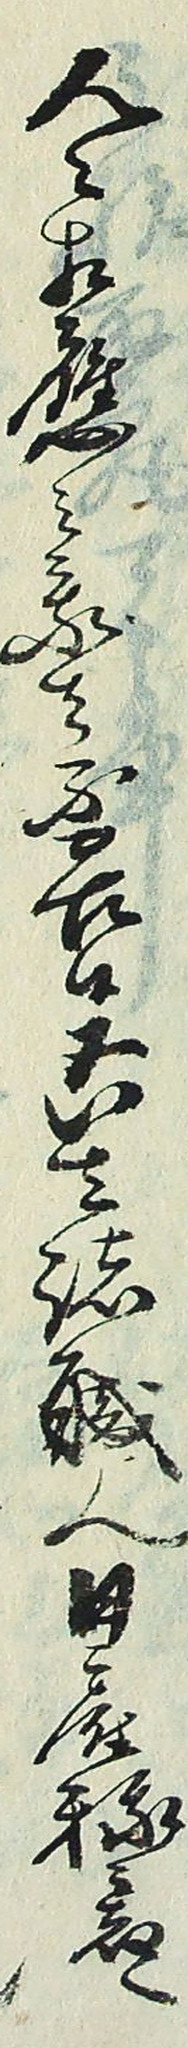人々相應之義者不苦候右者諸職人日雇稼之者へ
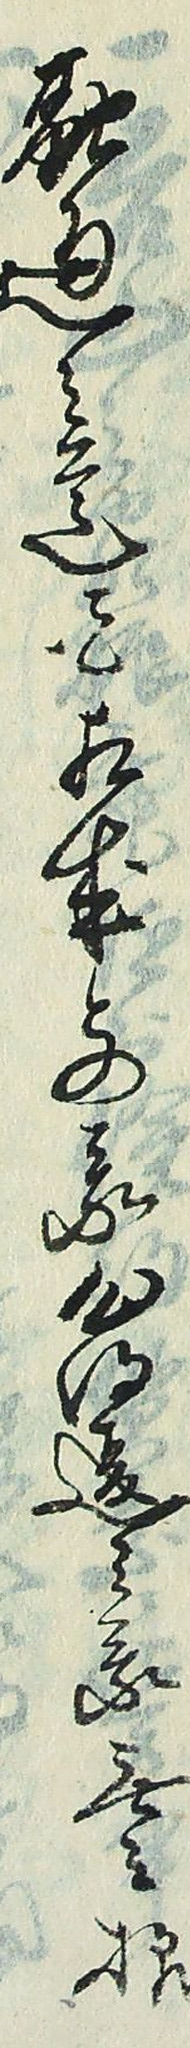融通之道とも相成との義心得違之義無之様
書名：諸御趣意書并御下知向之写
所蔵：鳴門教育大学 Naruto University of Education
